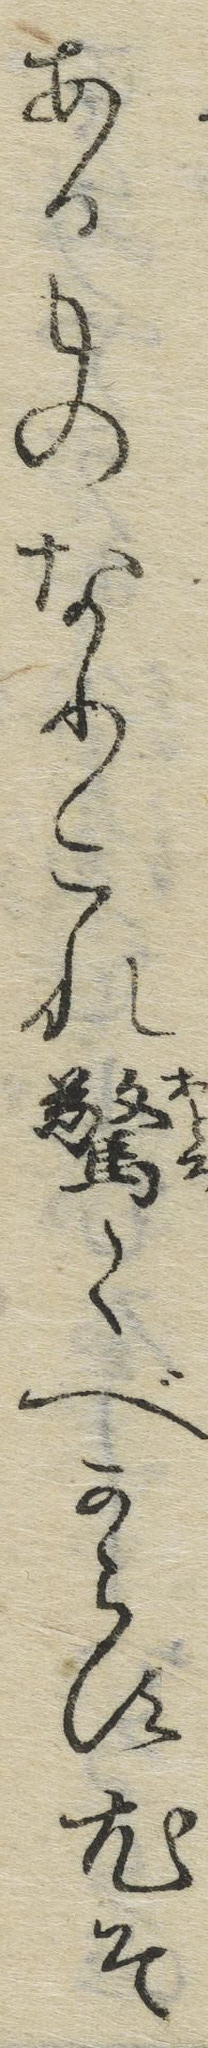あるものなりこれ驚くべからす尤そ
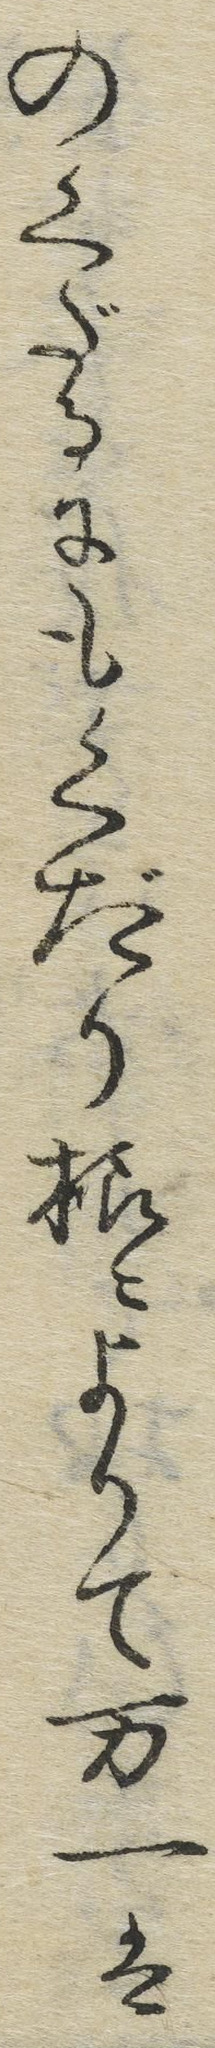のくだるにもくだり様によりて万一は
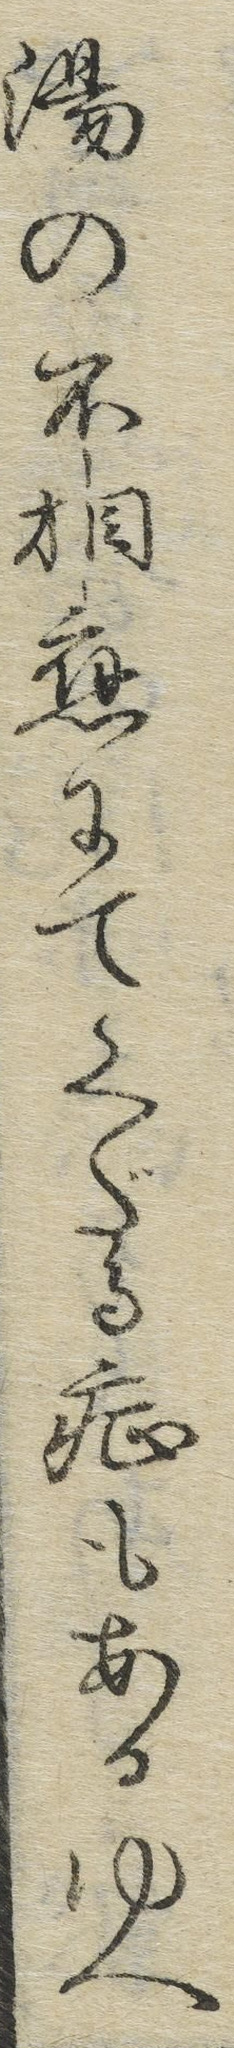湯の不相応にてくだる症もあるゆへ
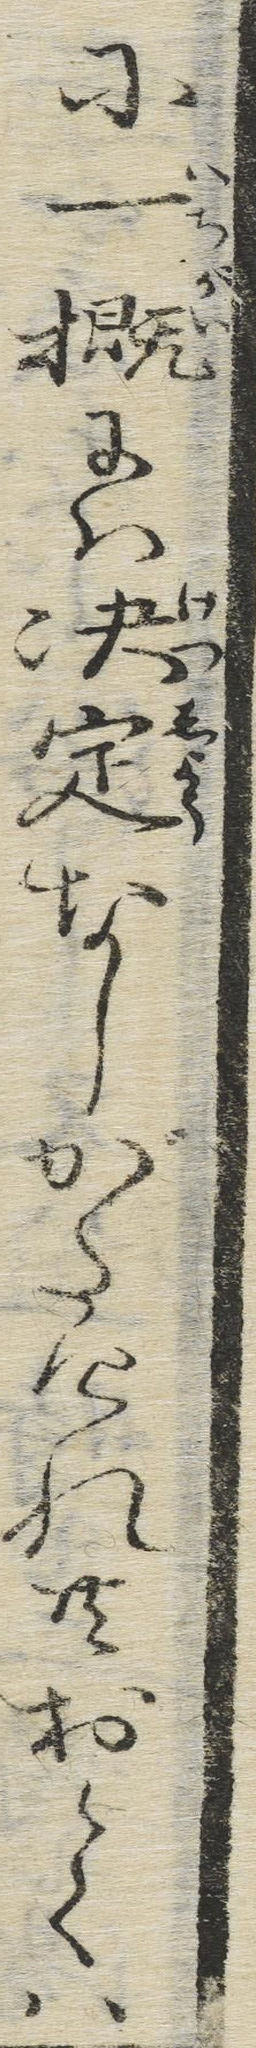に一概には決定なしがたけれ共おゝくハ
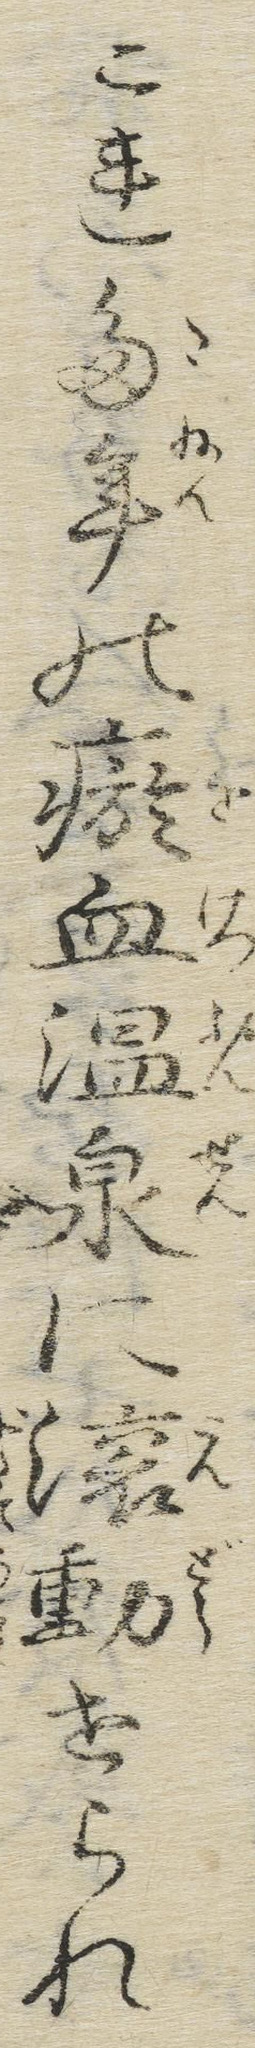これ多年の瘀血温泉に滾動せられ
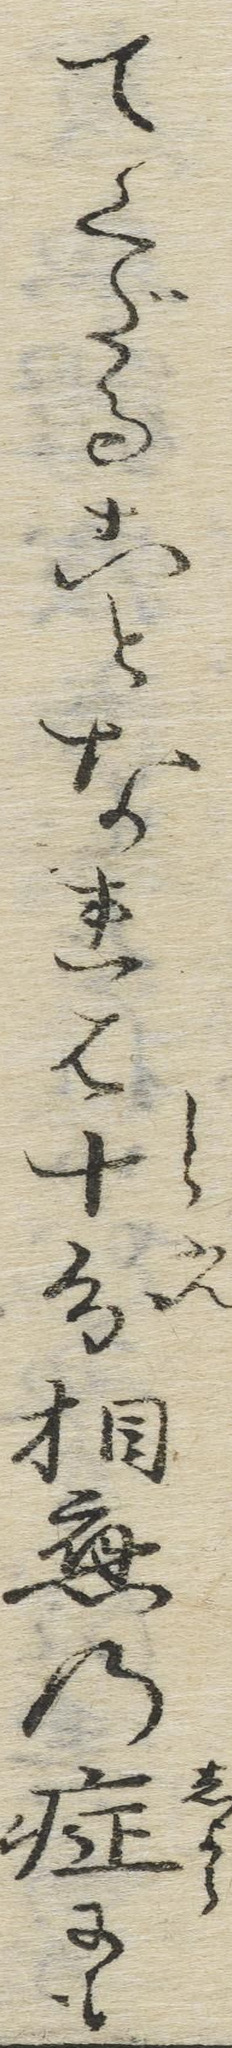てくだることなれは十分相応の症にも
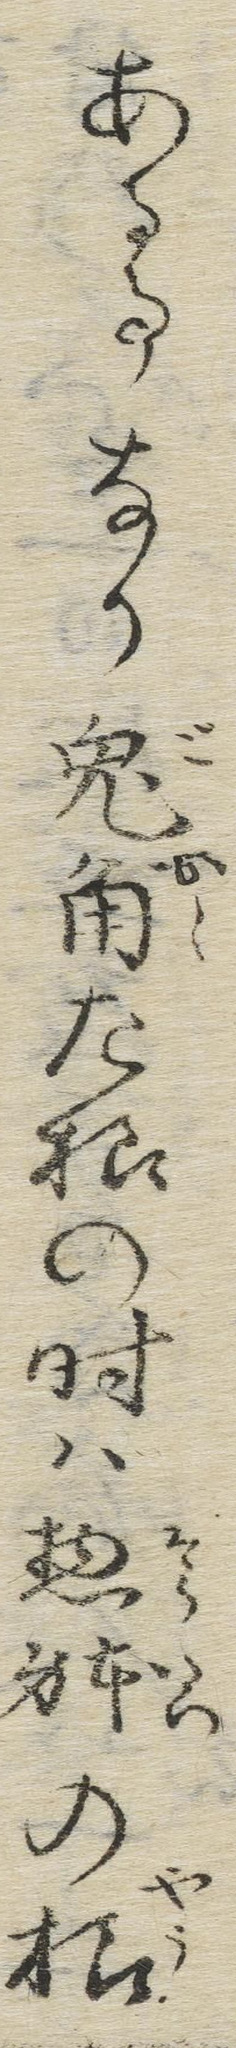ある事なり兎角左様の時は惣躰の様
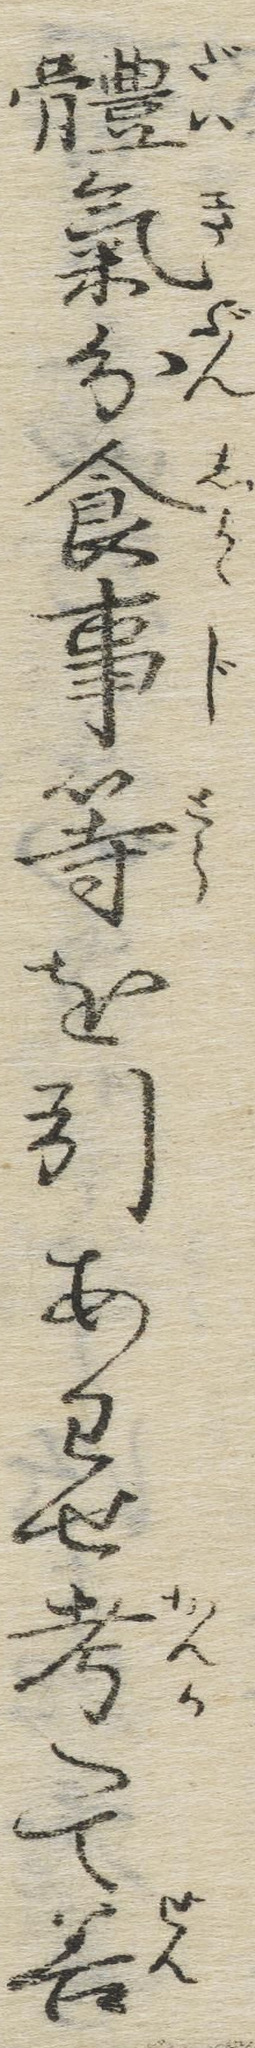体気分食事等を引あわせ考へて善
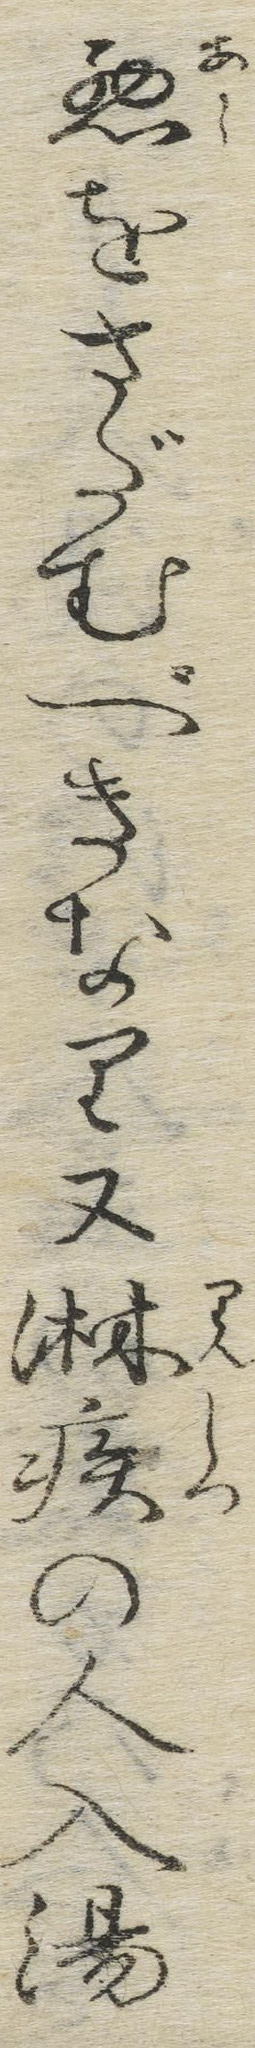悪をさだむべきなり又淋疾の人入湯
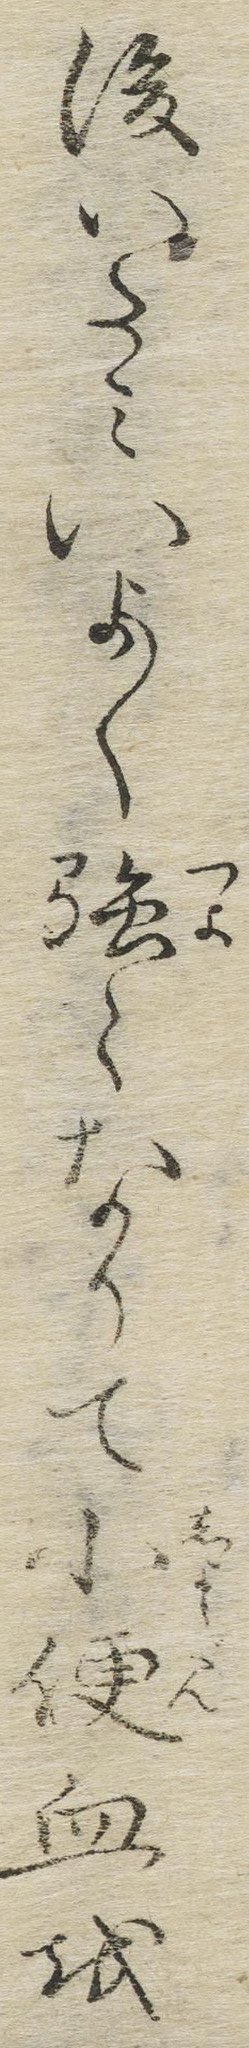後いたみいよ〳〵強くなりて小便血を
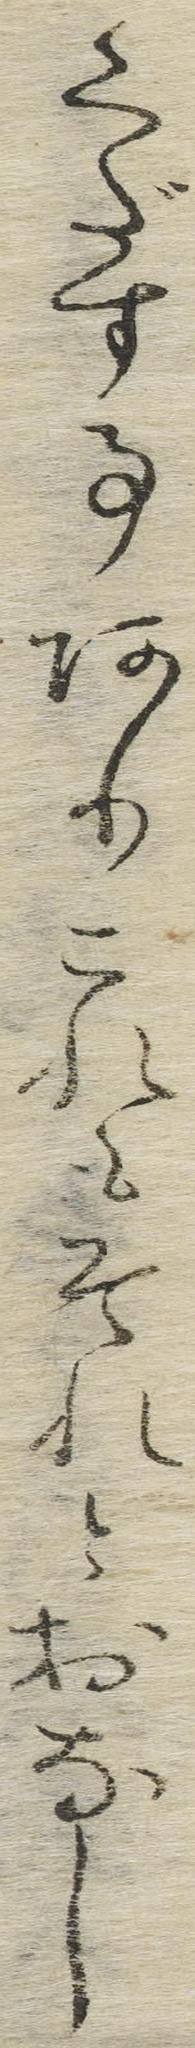くだす事ありこれもそれとおなし

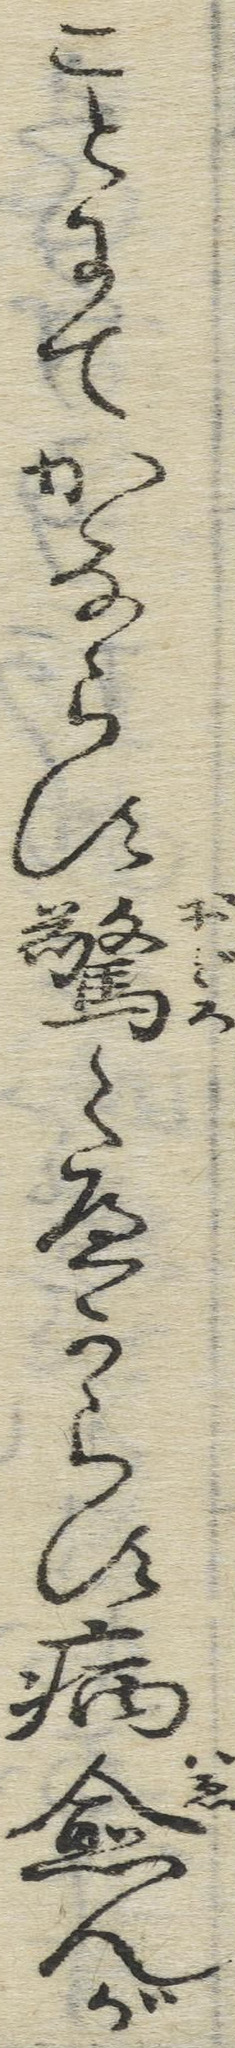ことにてかならす驚くへからす病愈んが
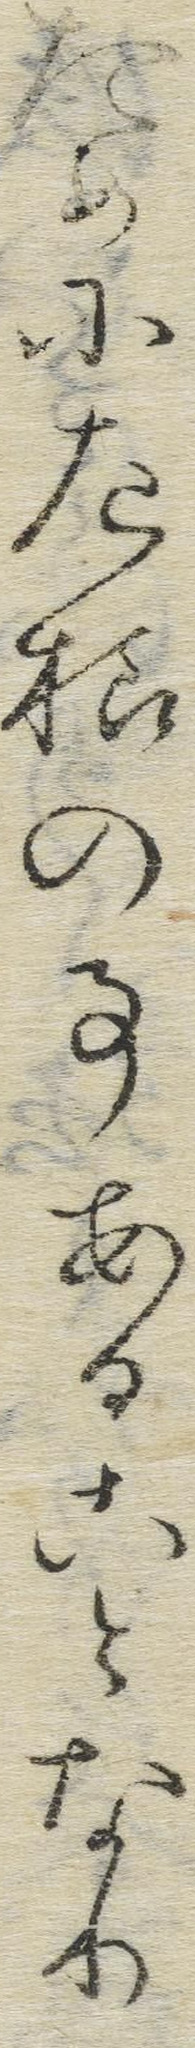ために左様の事あることなり
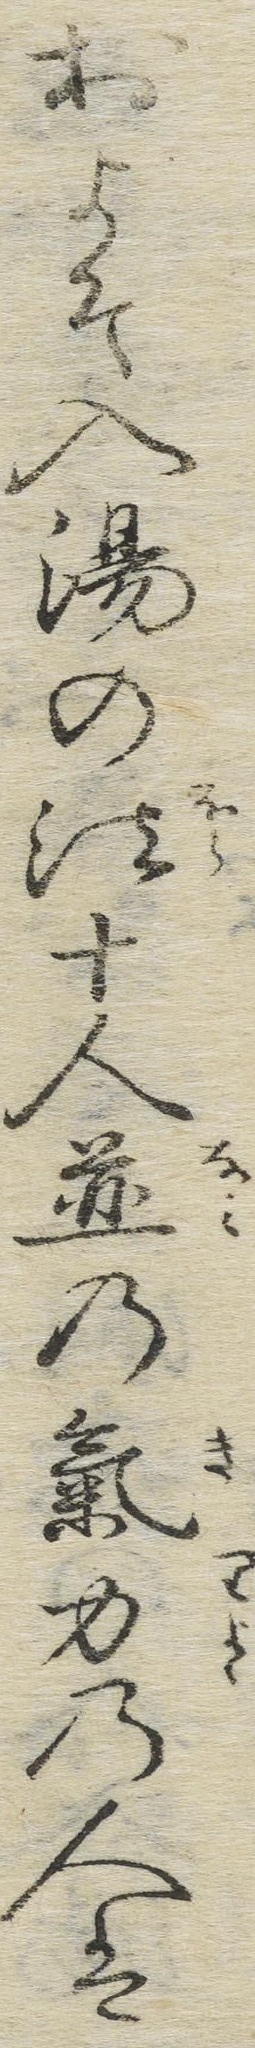一およそ入湯の法十人並の気力の人は
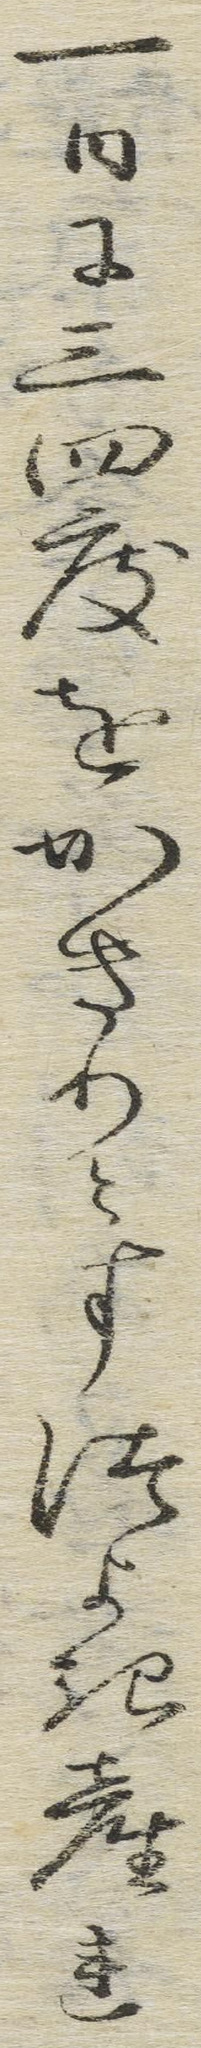一日に三四度をかきりとすつよき産れ
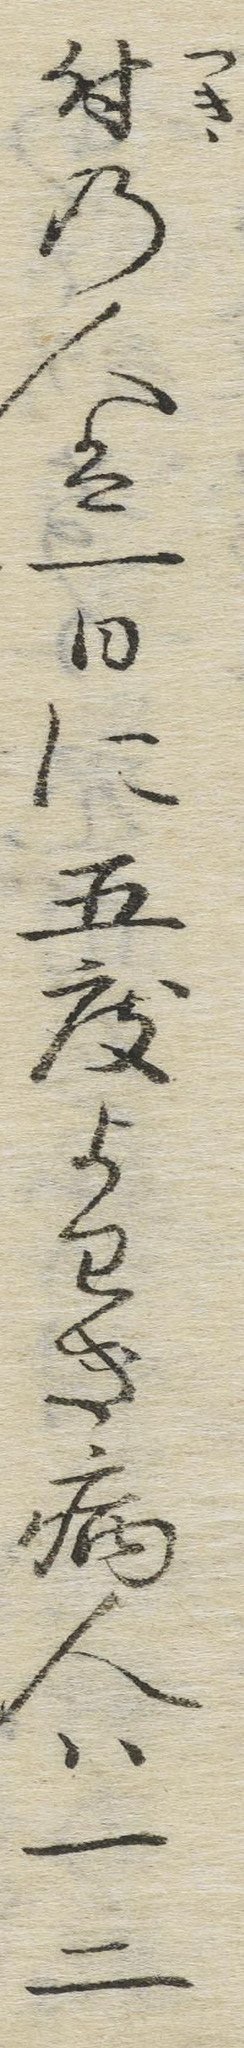付の人は一日に五度よわき病人は一二
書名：温泉考
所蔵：東京大学地震研究所図書室 Earthquake Research Institute Library, The University of Tokyo, JAPAN
